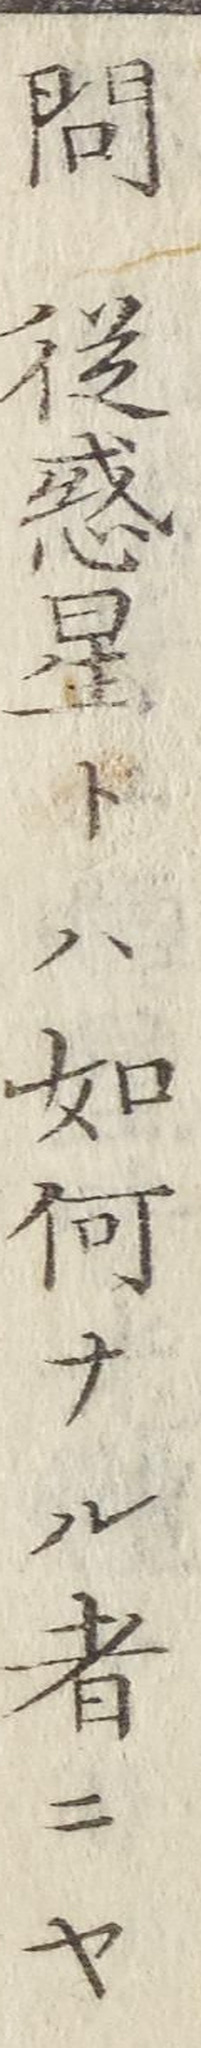問従惑星トハ如何ナル者ニヤ
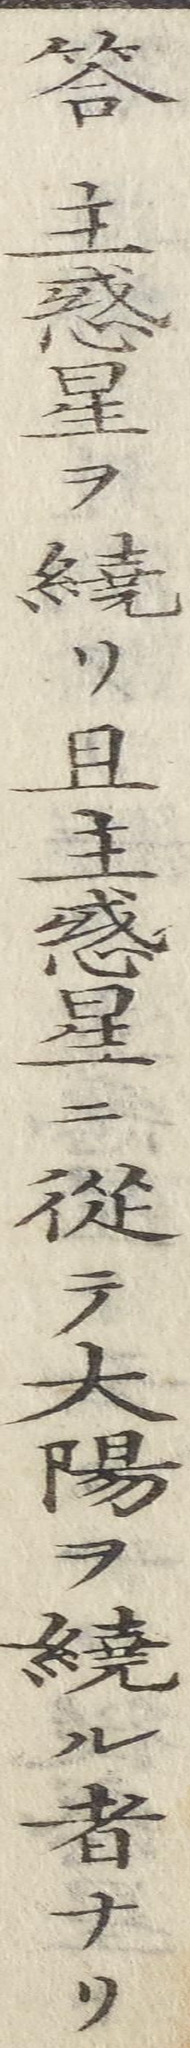答主惑星ヲ繞リ且主惑星ニ従テ大陽ヲ繞ル者ナリ
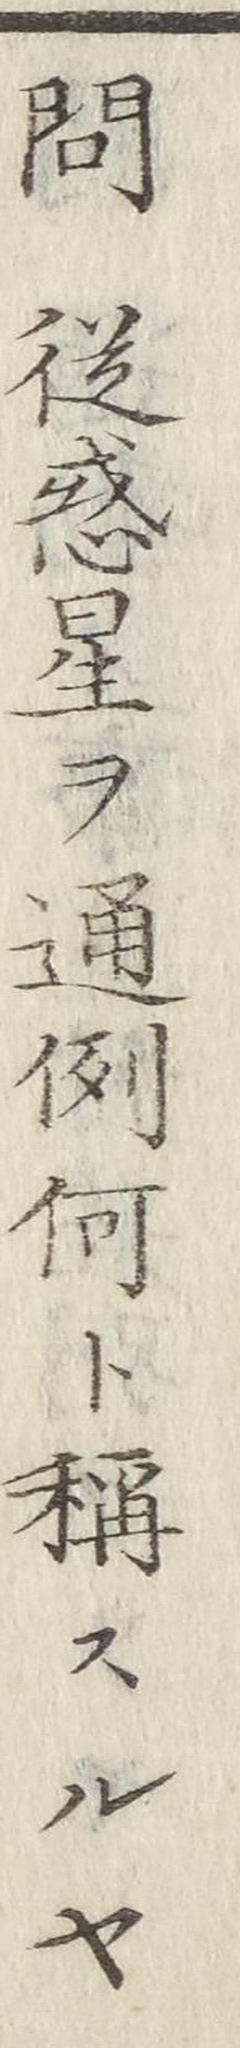問従惑星ヲ通例何ト称スルヤ
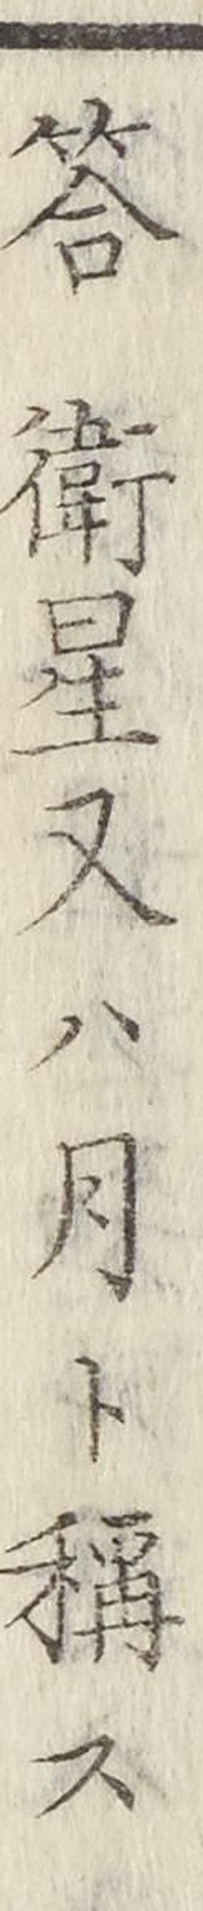答衛星又ハ月ト称ス
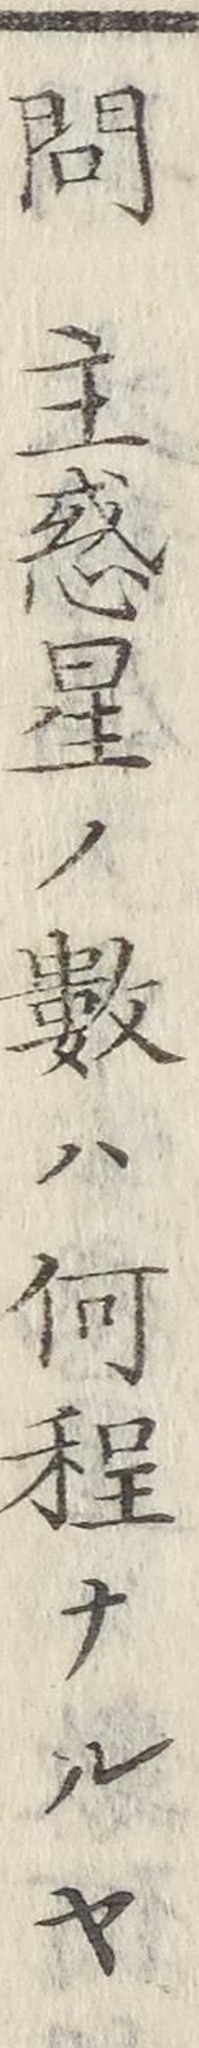問主惑星ノ数ハ何程ナルヤ
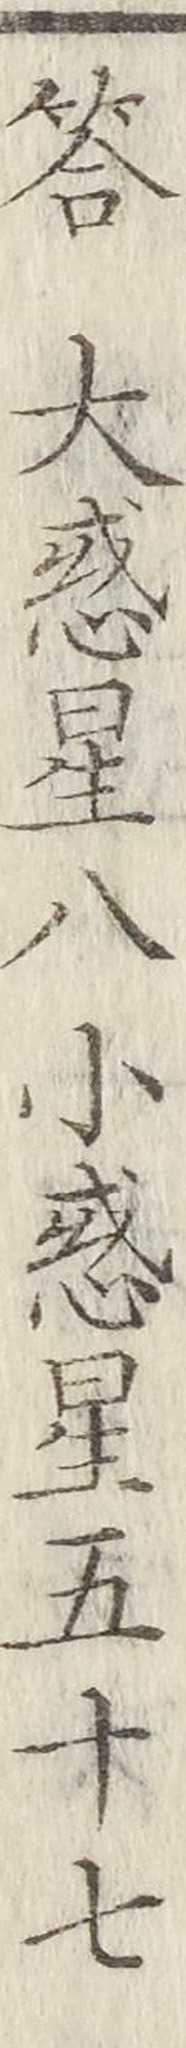答大惑星八小惑星五十七
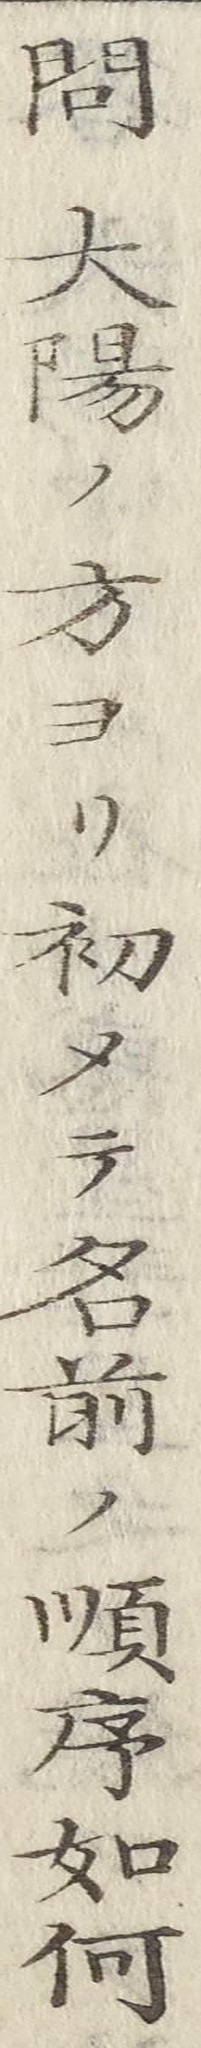問大陽ノ方ヨリ初メテ名前ノ順序如何
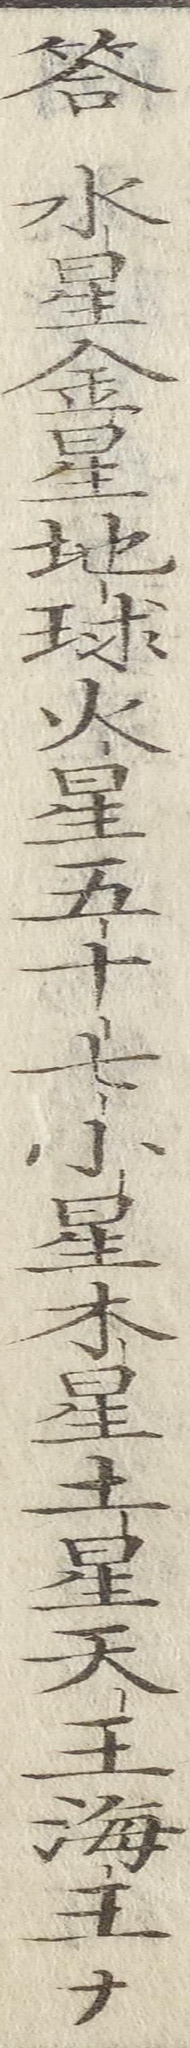答水-星金-星地-球火-星五-十-七-小-星木-星土-星天-王海-王ナ
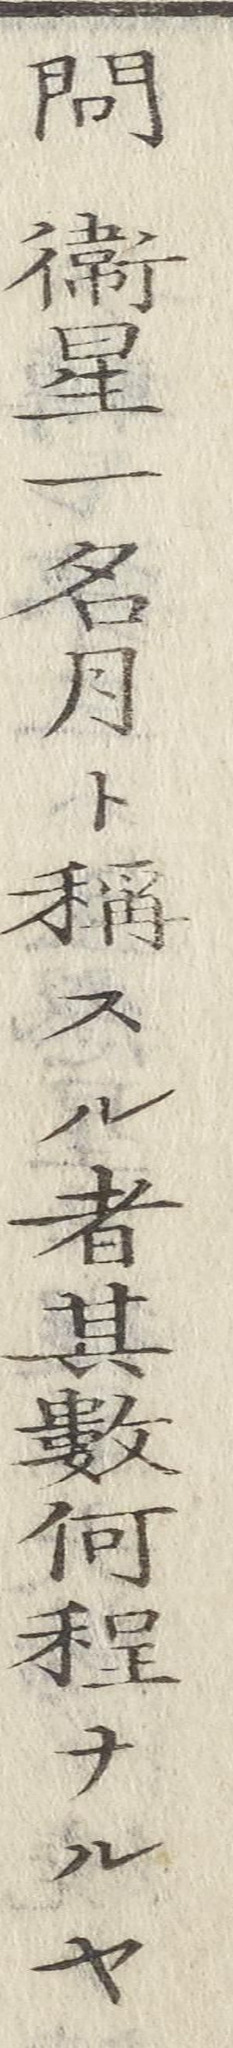問衛星一名月ト称スル者其数何程ナルヤ
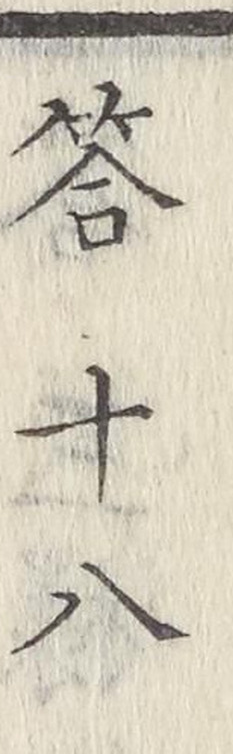答十八
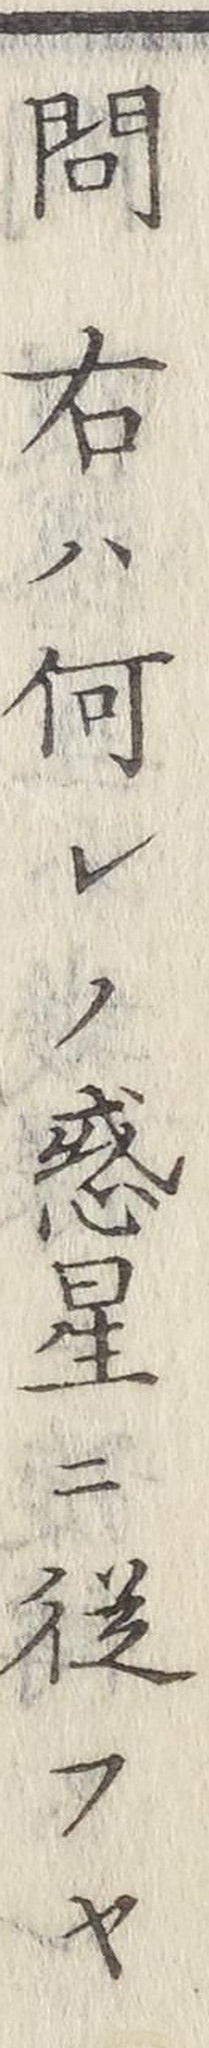問右ハ何レノ惑星ニ従フヤ
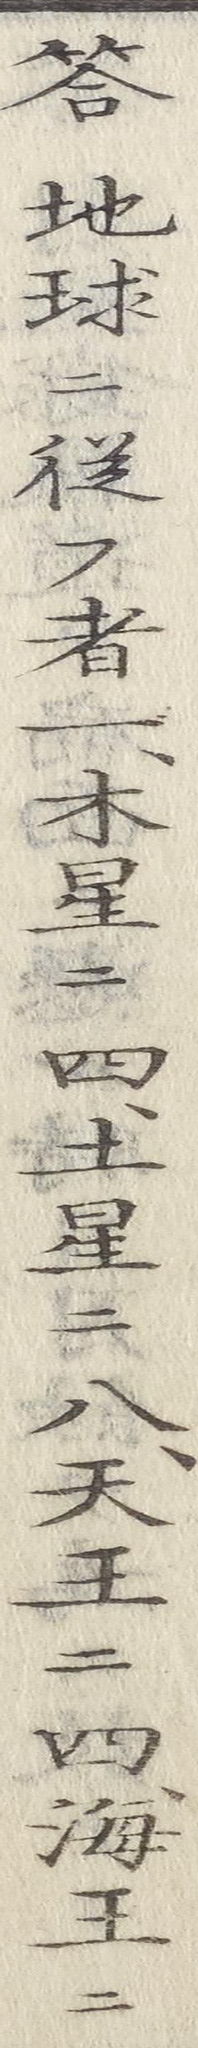答地球ニ従フ者一、木星ニ四、土星ニ八、天王ニ四、海王ニ
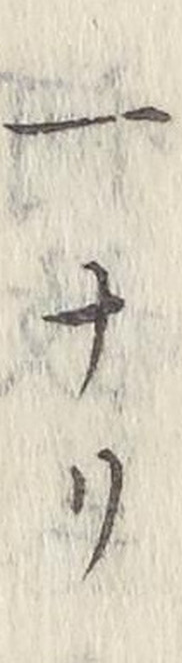一ナリ
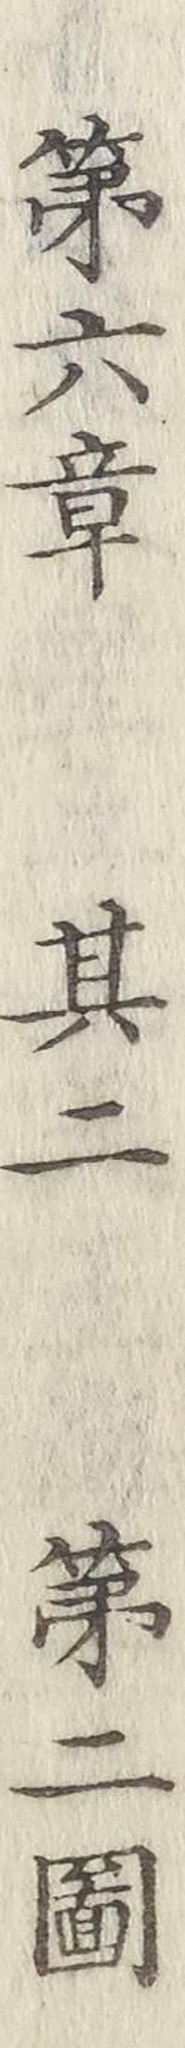第六章其二第二図
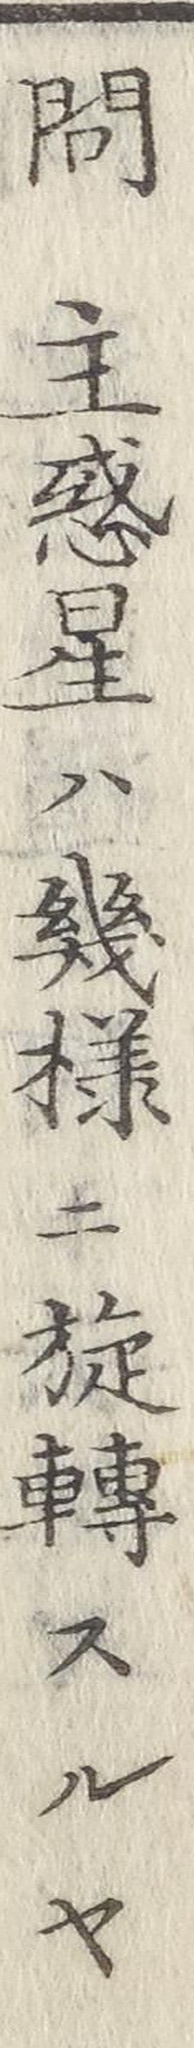問主惑星ハ幾様ニ旋転スルヤ
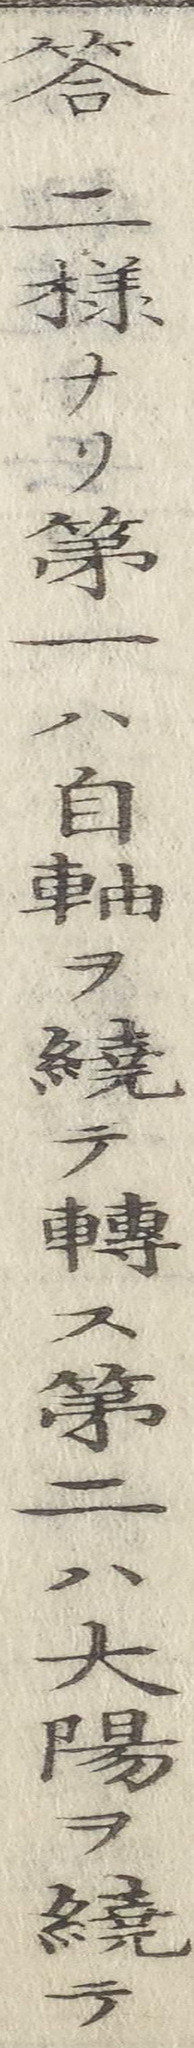答二様ナリ第一ハ自軸ヲ繞テ転ス第二ハ大陽ヲ繞テ
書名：星学圖説　上
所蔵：東京大学地震研究所図書室 Earthquake Research Institute Library, The University of Tokyo, JAPAN
